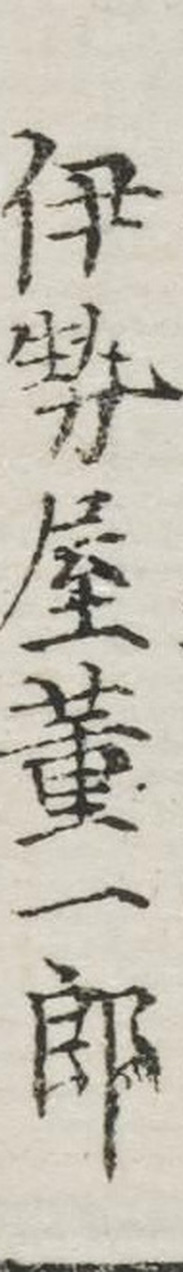伊勢屋菫一郎
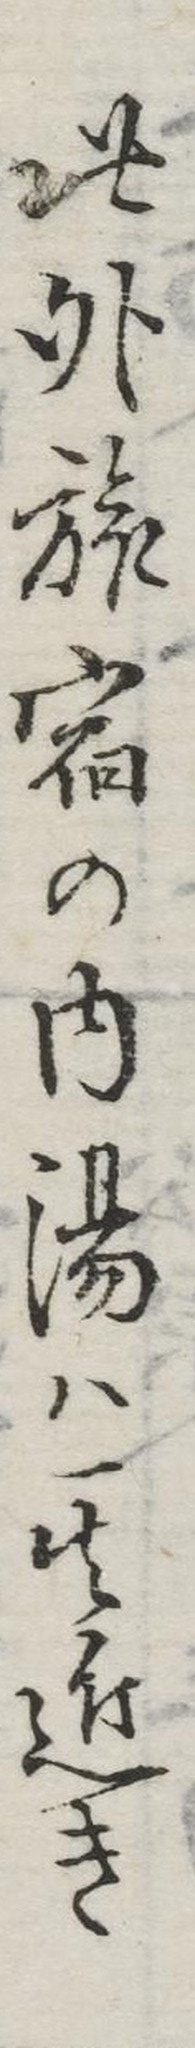此外旅宿の内湯ハ其近き
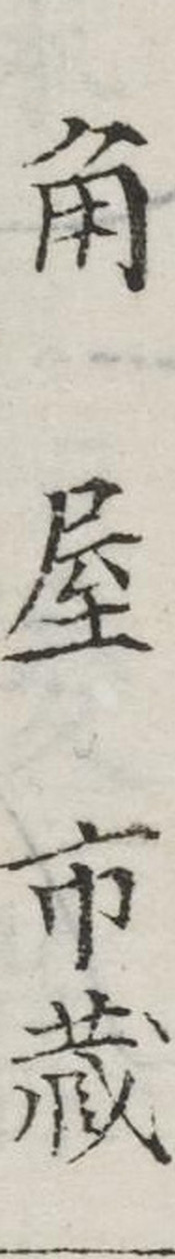角屋市蔵
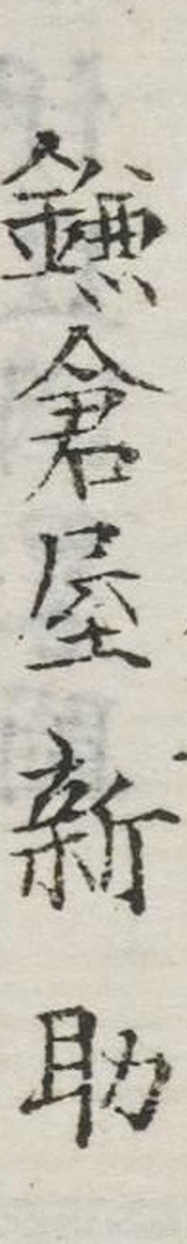鎌倉屋新助
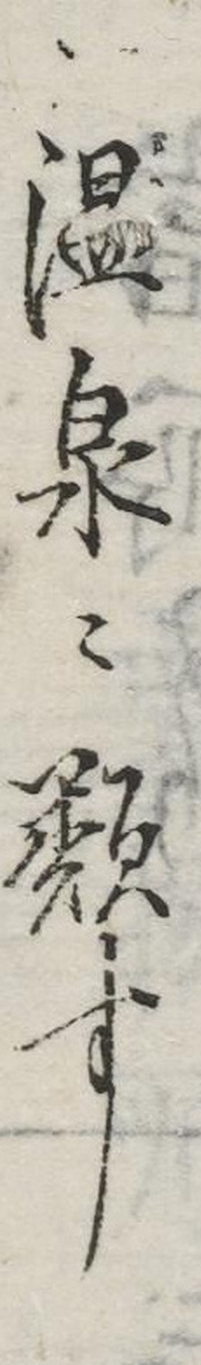温泉に類す
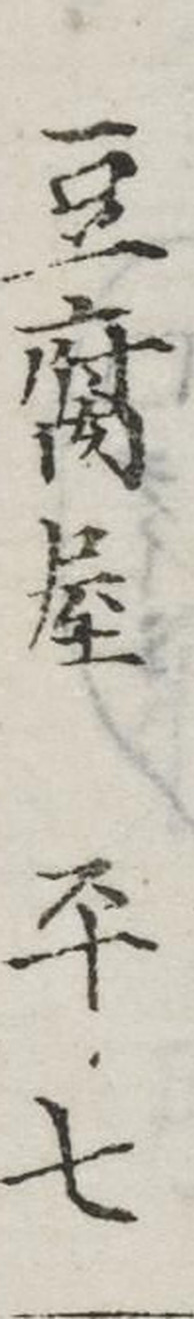豆腐屋平七
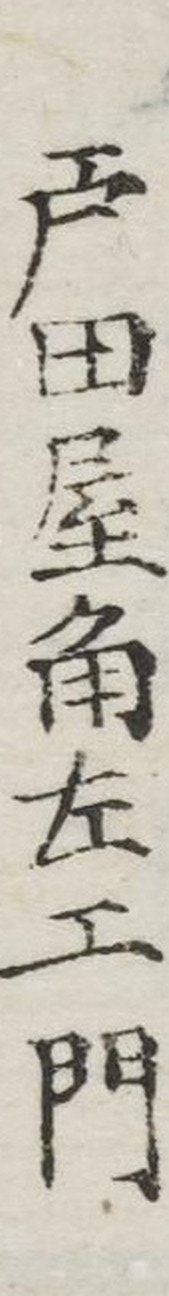戸田屋角左ェ門
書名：伊豆国修善寺温泉名所記　全
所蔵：東京大学地震研究所図書室 Earthquake Research Institute Library, The University of Tokyo, JAPAN
